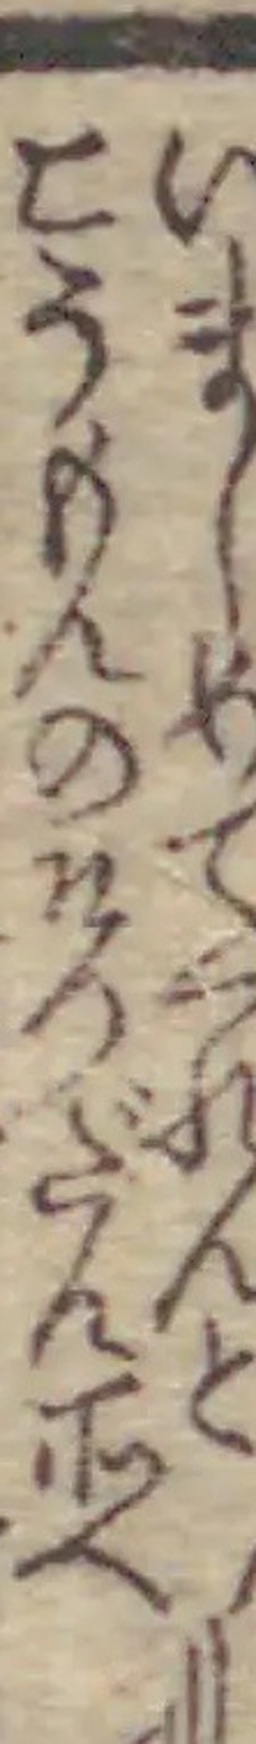こうもんのけつだん所へ
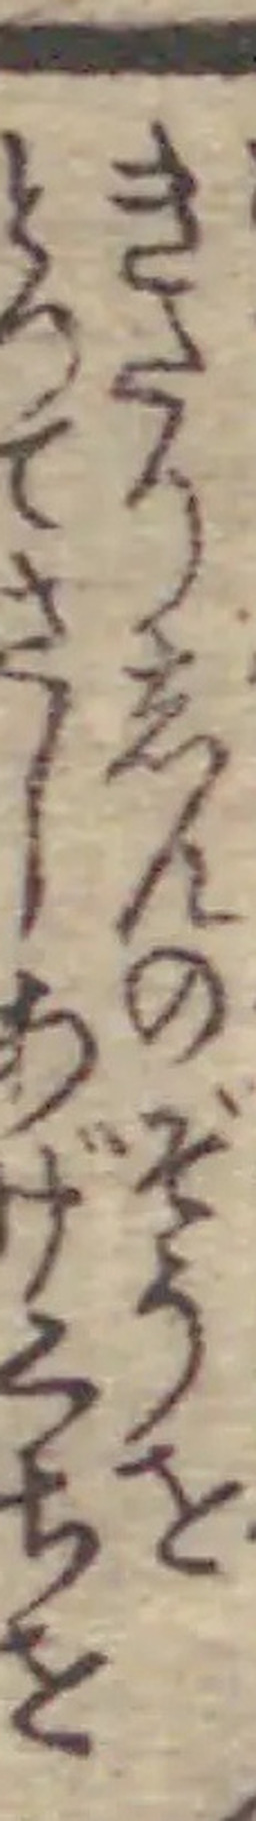とつてさしあげくちを
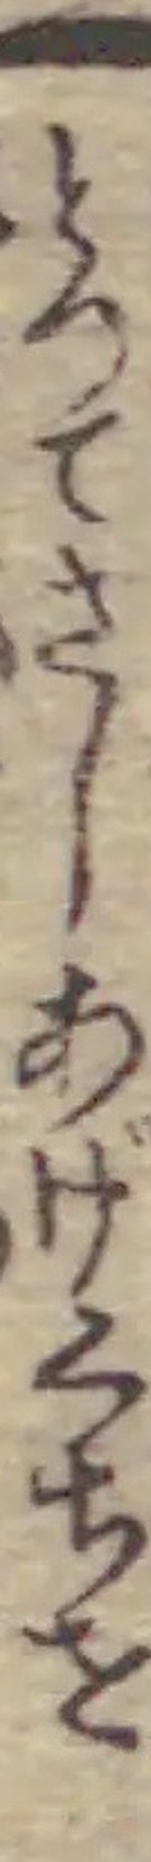とつてさしあげくちを
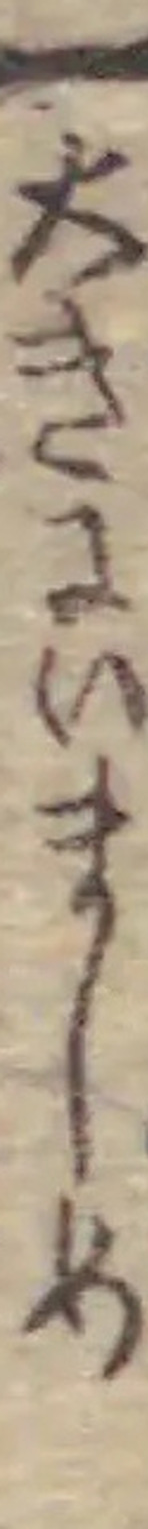大きにいましめ
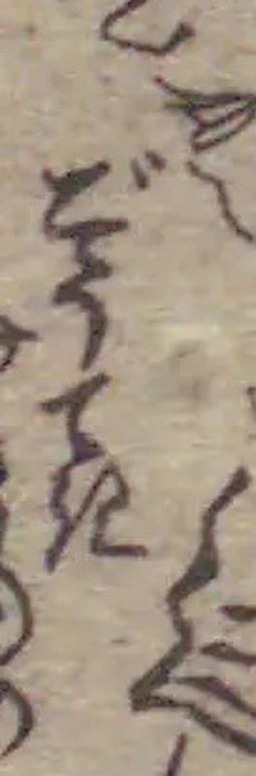ごうてき
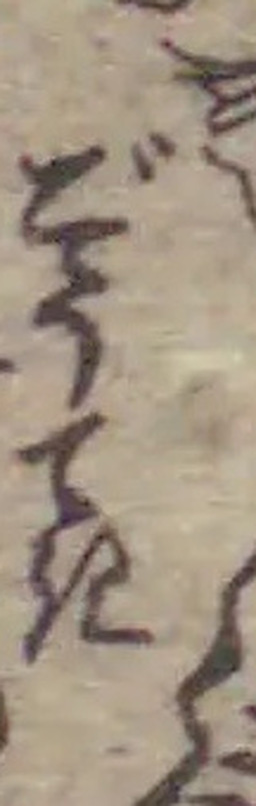ごうてき
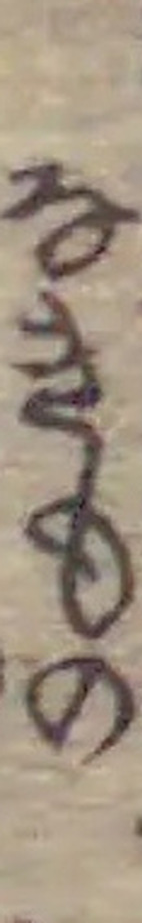なきもの
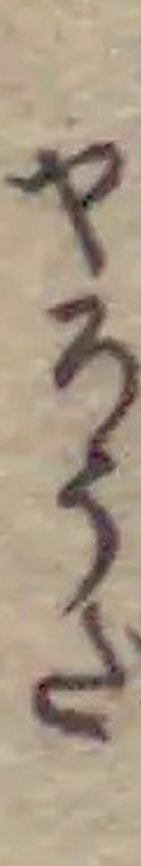やろうだ

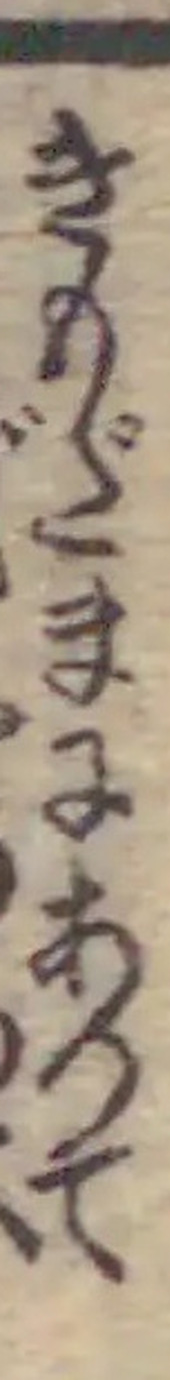きもだまにあつて
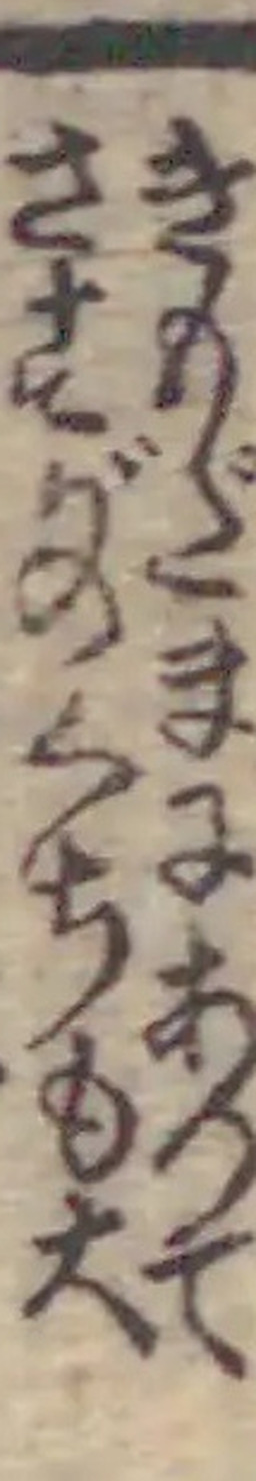さすがのくちも大
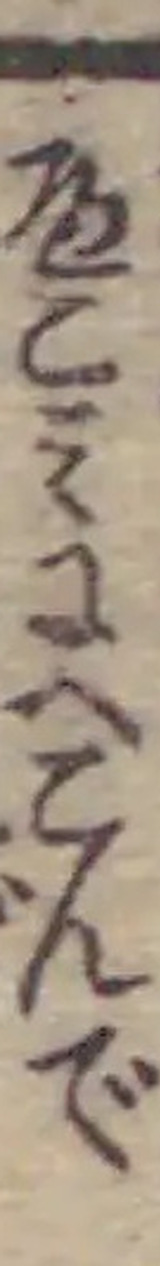へこみにへこんで
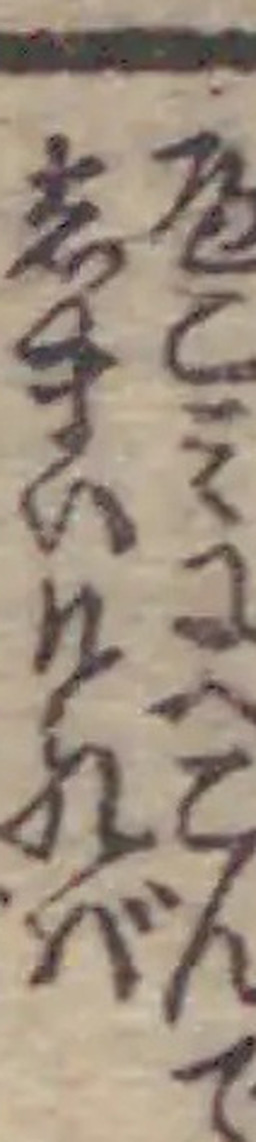しまいければ
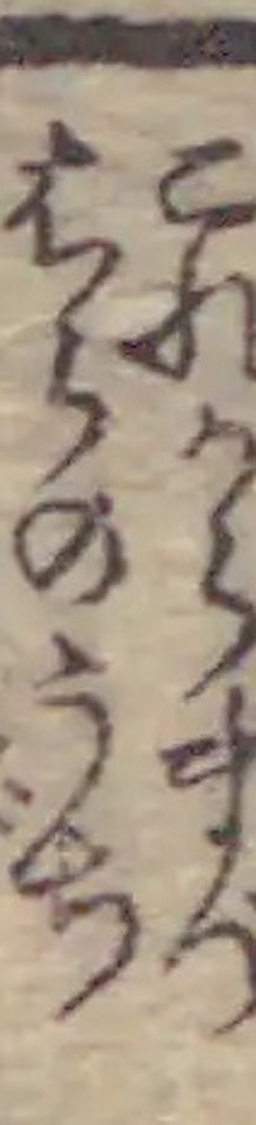はらのうち
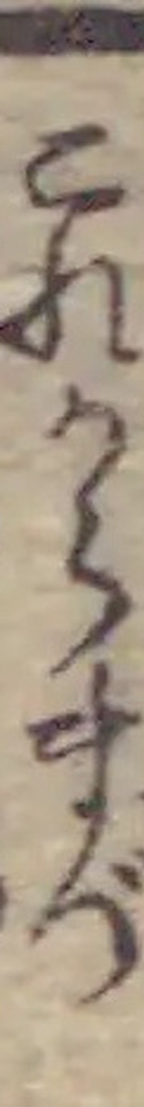これからまづ
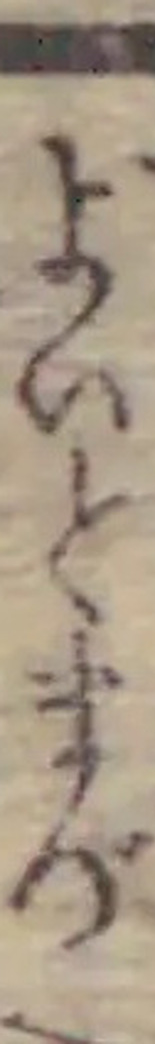よいとまづ
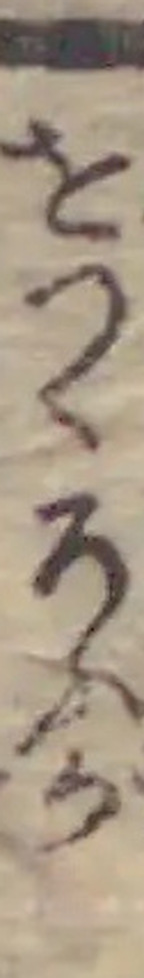をつくろふが
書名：腹内養生主論 3巻
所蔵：国立国会図書館 National Diet Library, JAPAN
